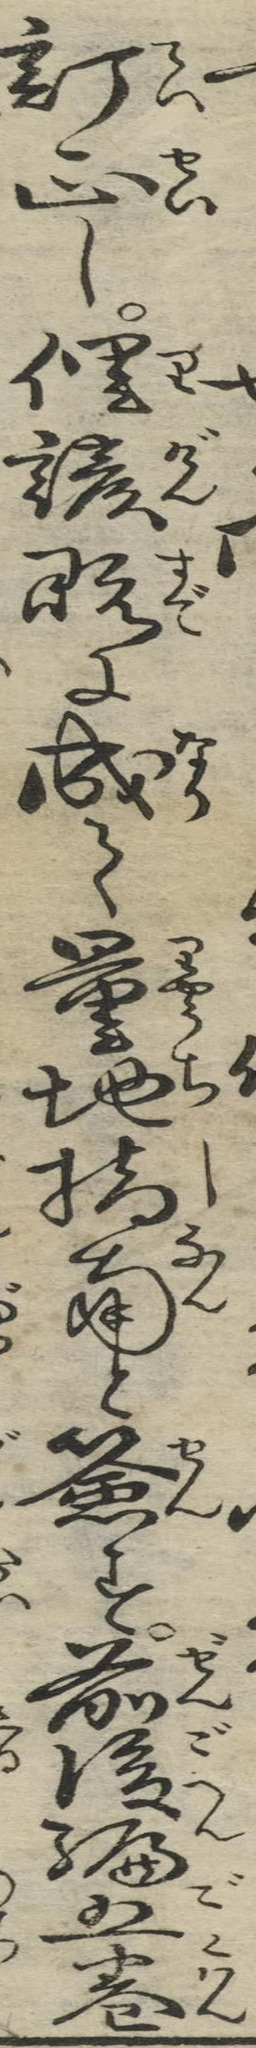訂正し。俚諺既に成て量地指南と僉す。前後編五巻
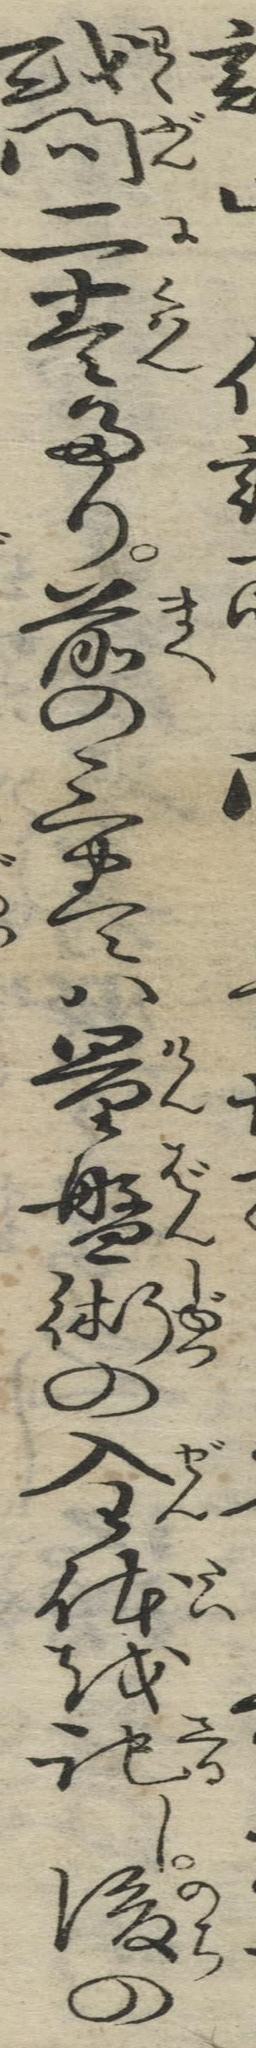或問二巻たり。前の三巻は量盤術の全体を記し。後の
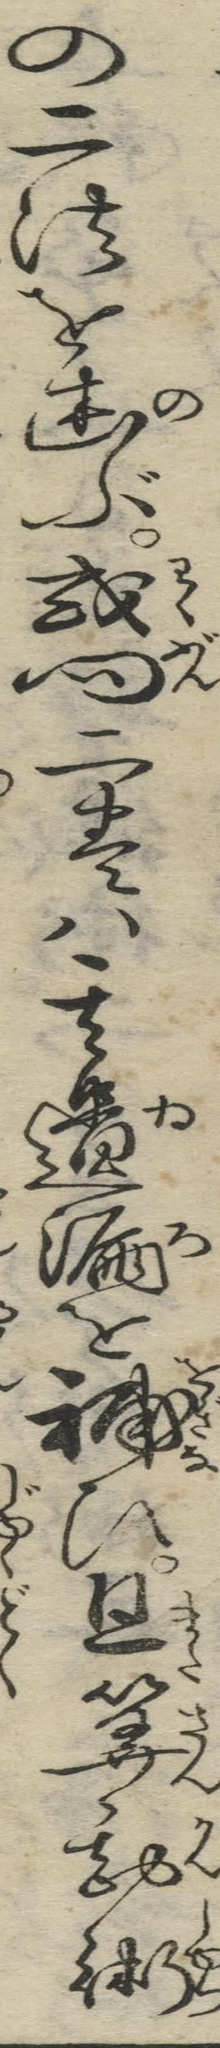の二法を述ぶ。或問二巻は其遺漏を補ひ且算勘術
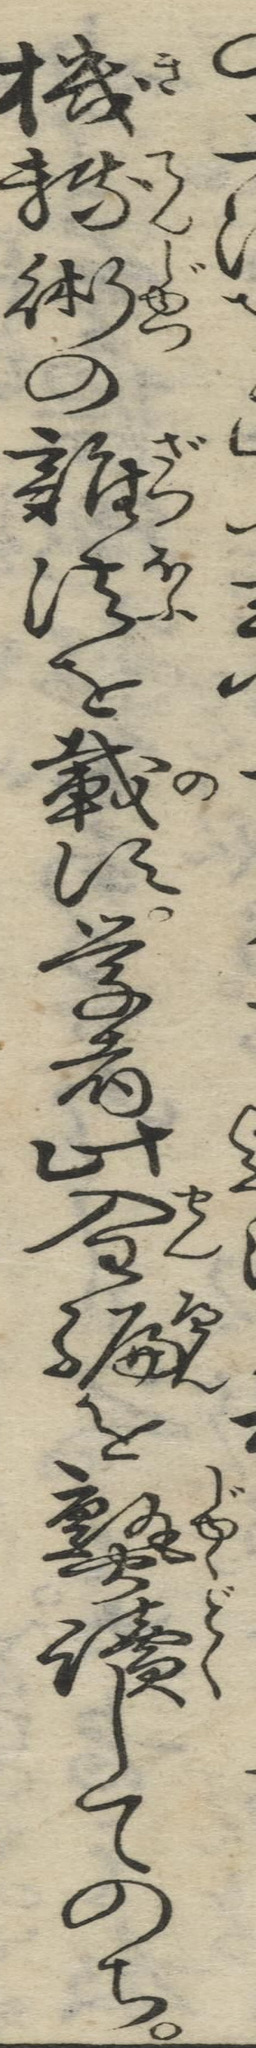機転術の雑法を載す。学者此全編を熟読してのち。
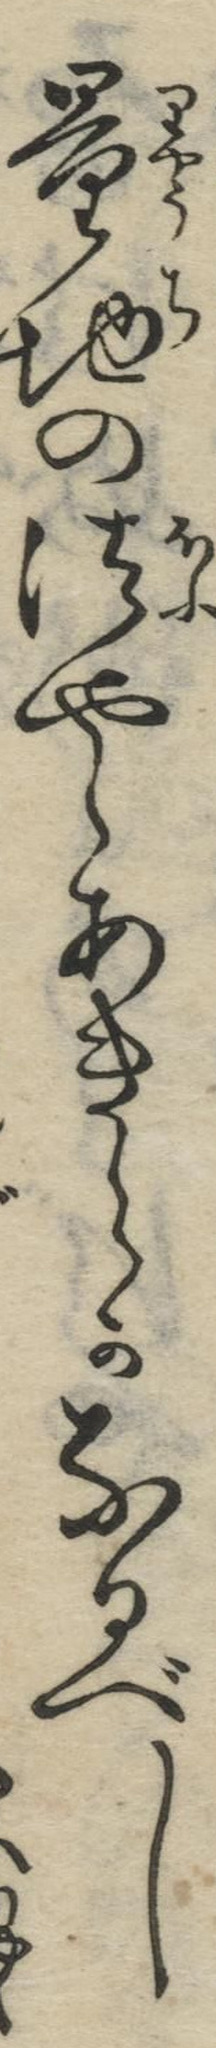量地の法やゝあきらかなるべし
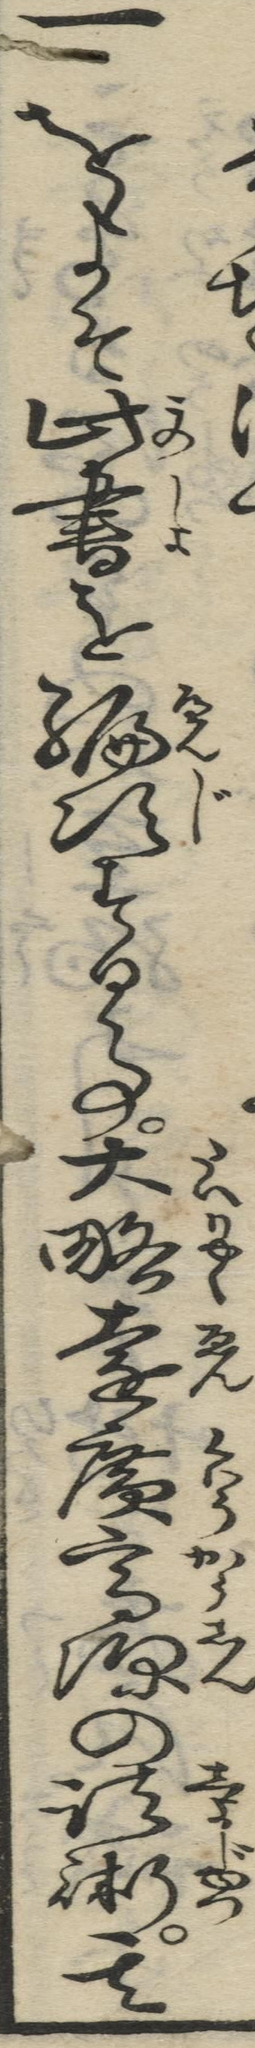一をよそ此書を編次する事。大略遠広高深の諸術。其
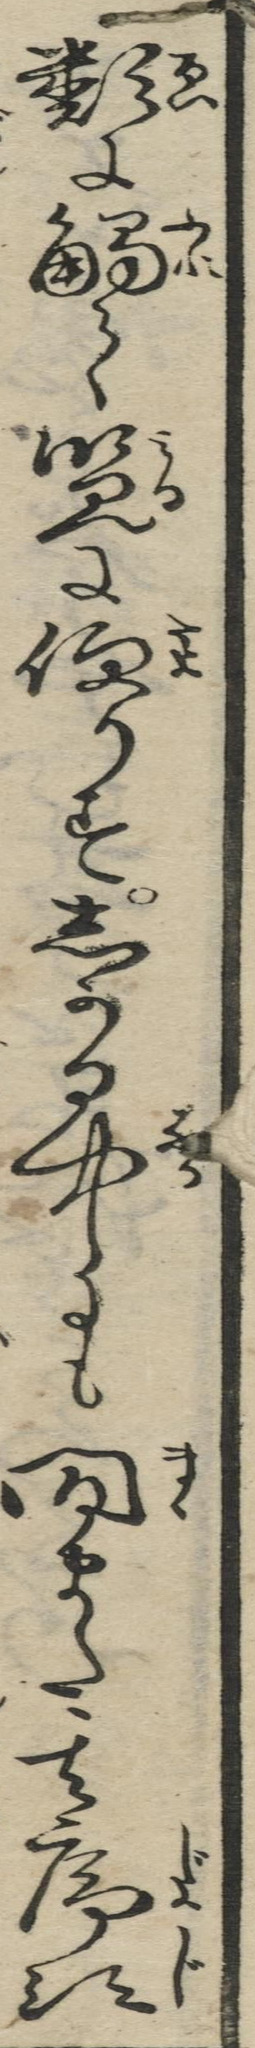類に触て覧に便りす。しかる中にも間また其序次
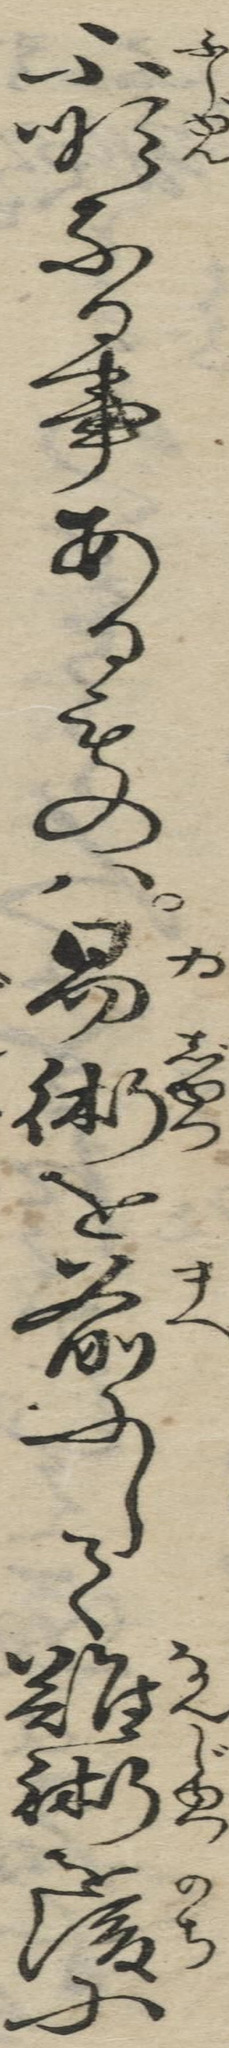不順なる事あるものは。易術を前にして難術を後に
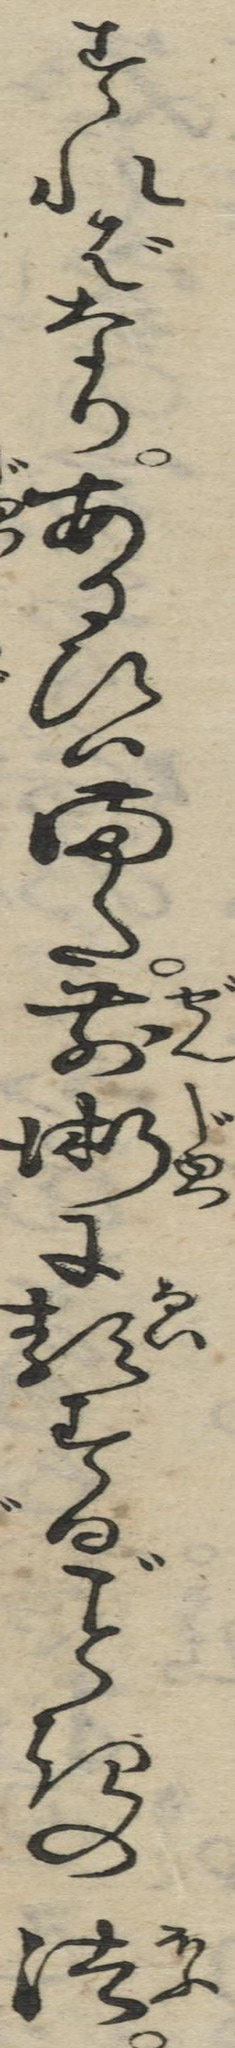すればなり。あるひはまた。前術に類するごときの法。
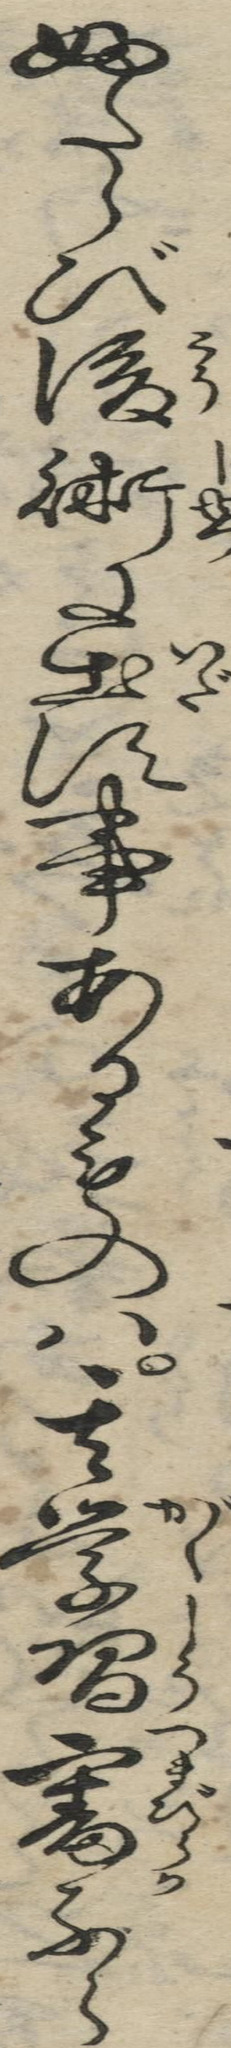ふたゝび後術に出す事あるものは其学習審なら
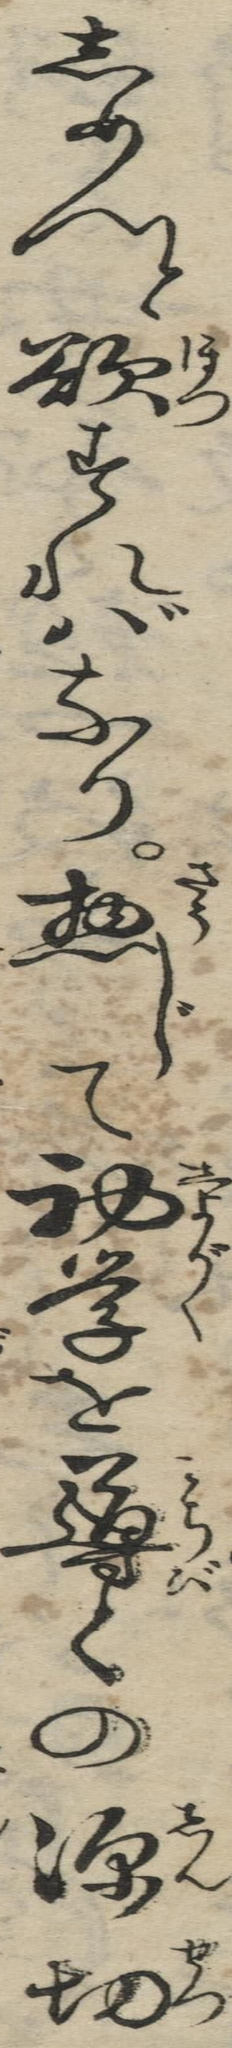しめんと欲すればなり。惣じて初学を導くの深切
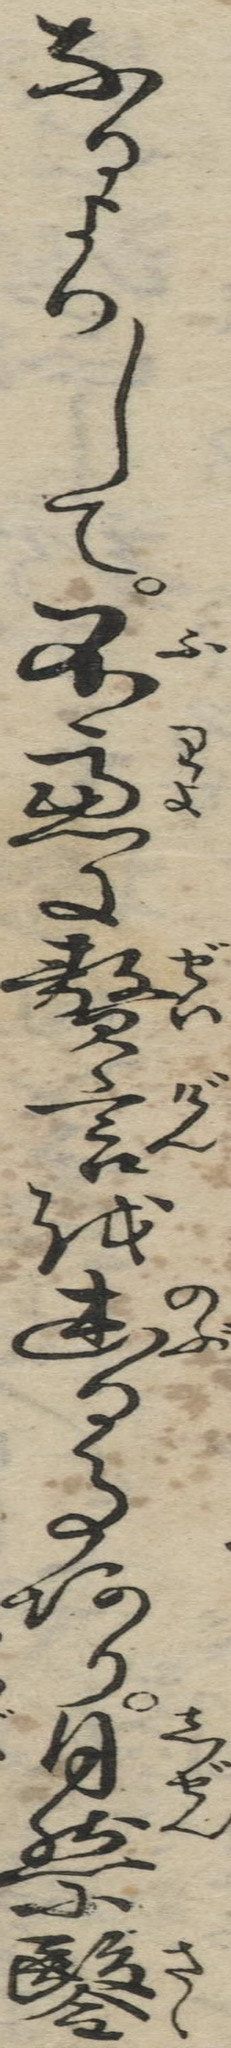なるよりして。不慮に贅言を述る事あり。自然に鑿
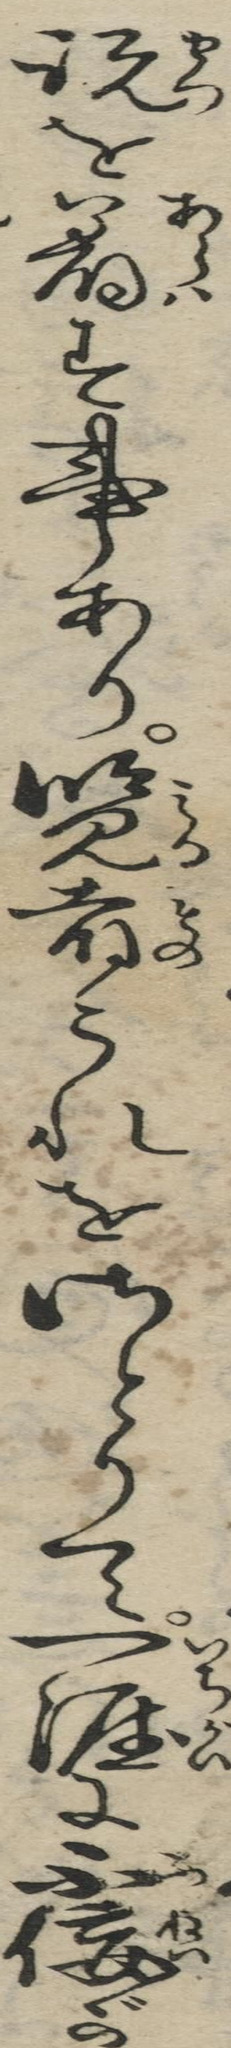説を著す事あり。覧者これをさとりて一涯に不侫が
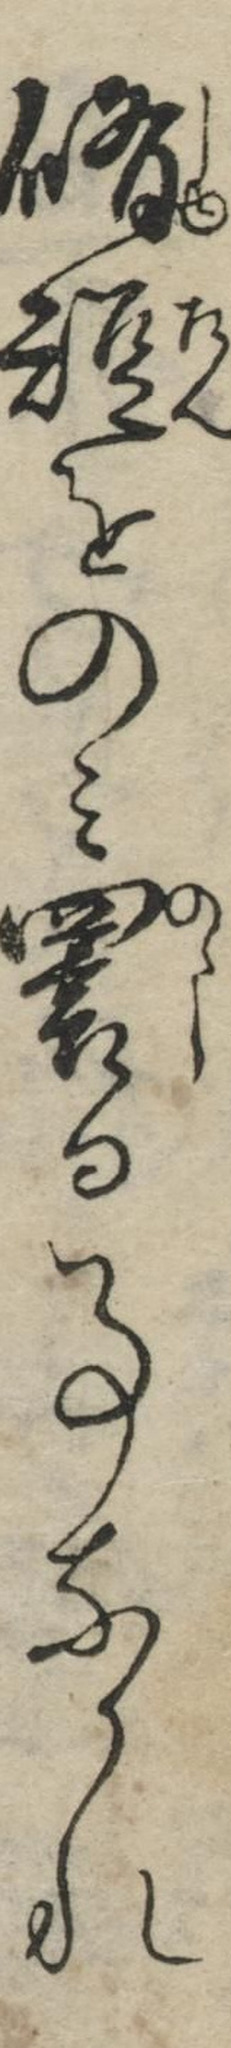脩短をのみ罵る事なかれ
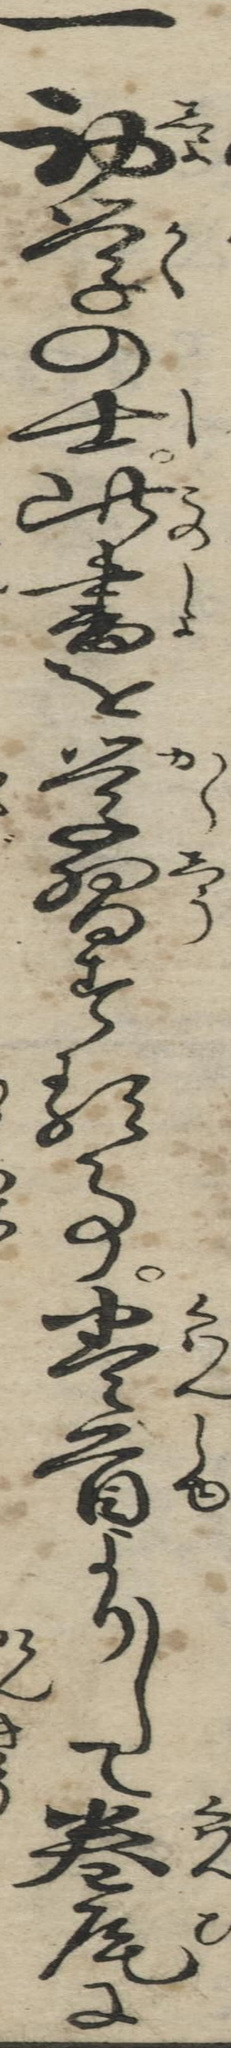一初学の士。此書を学習する事。巻首よりして巻尾に
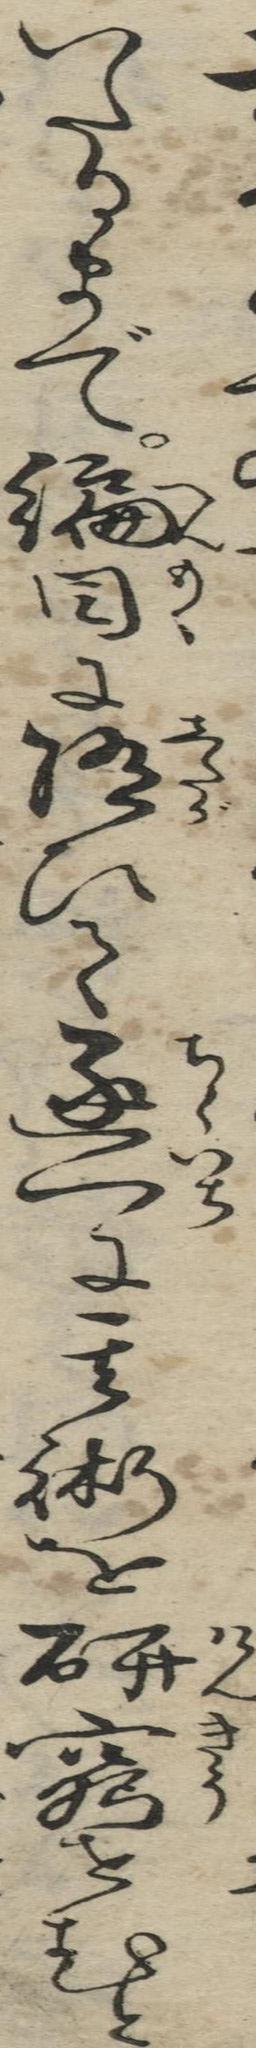いたるまで。編目に従ひて逐一に其術を研窮せむと
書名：量地指南　巻之一（内題）
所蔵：東京大学地震研究所図書室 Earthquake Research Institute Library, The University of Tokyo, JAPAN
